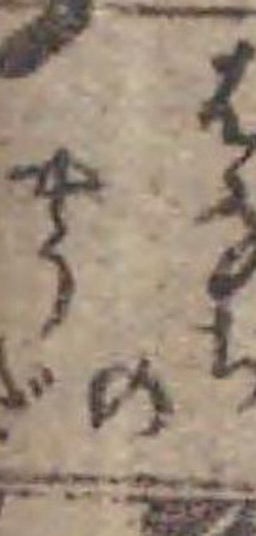やうご
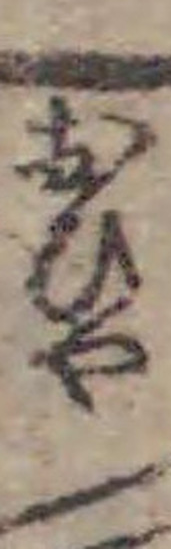おひや
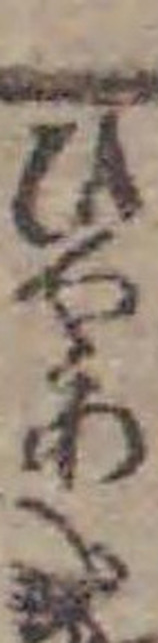ひやあ
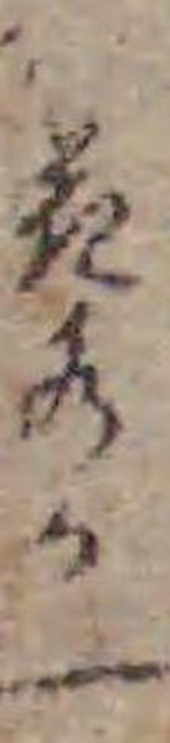花水か

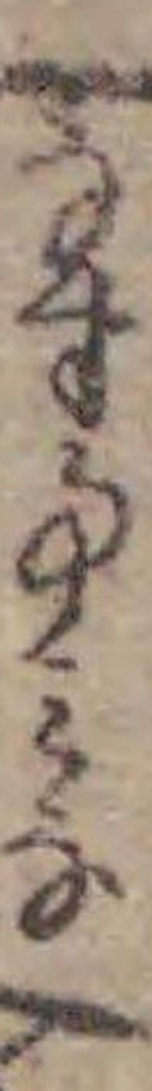なす事みな
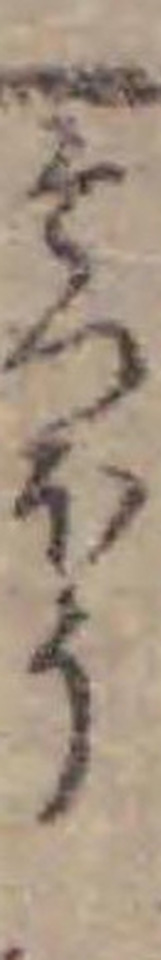そつほう
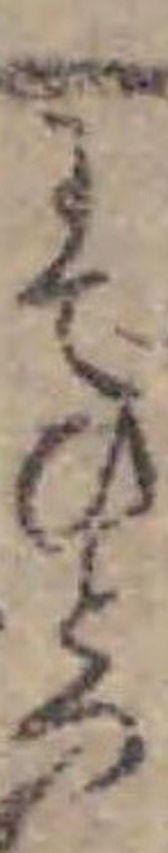にてひとつ
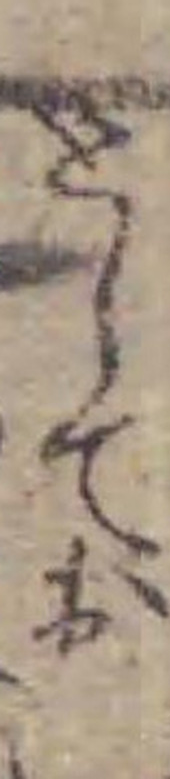としてお
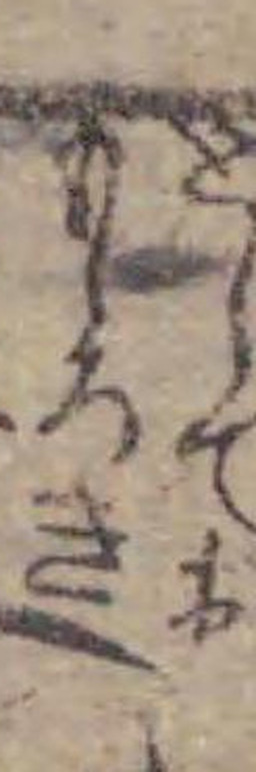もしろき
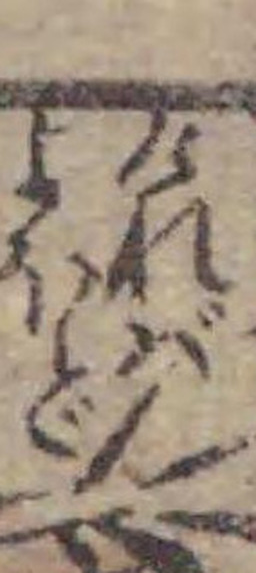よほど
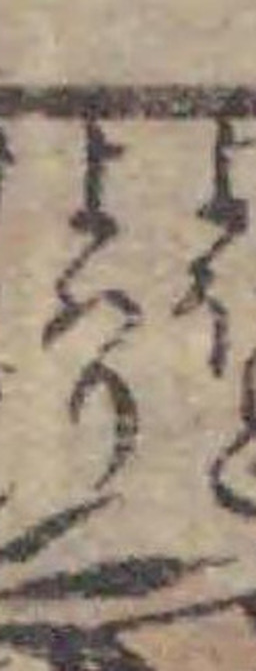よはり
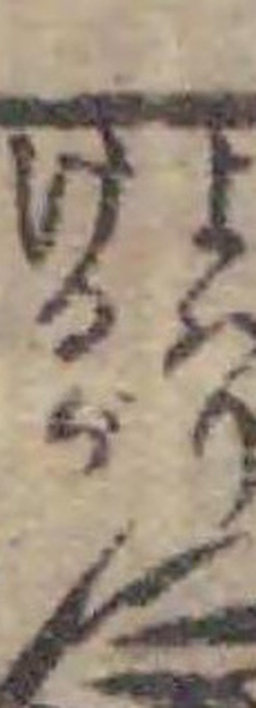けるが
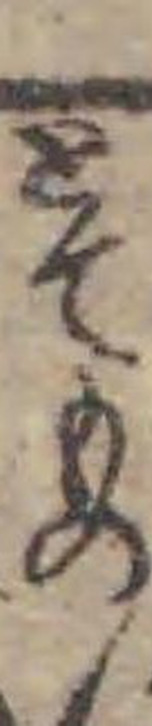とてもの
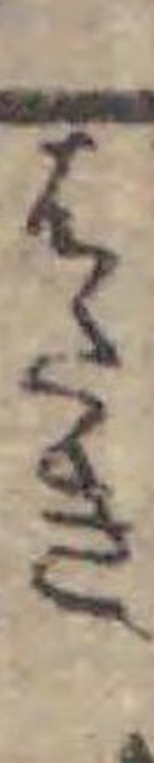はたき
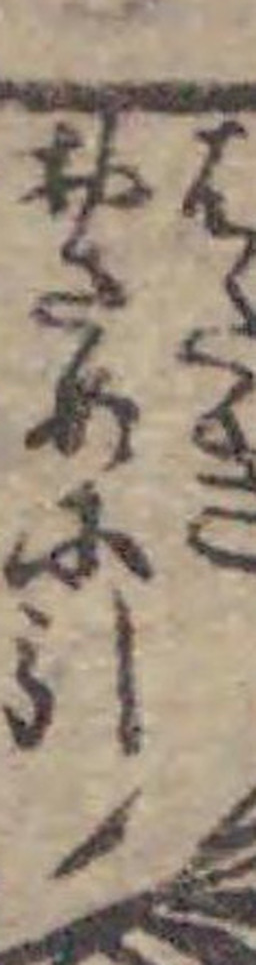おさめに引
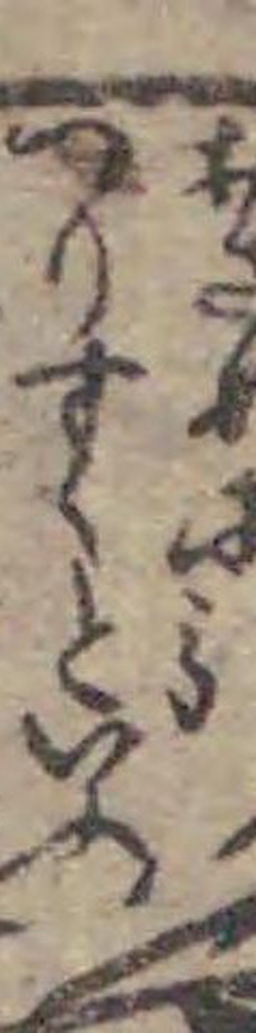つりすゝといふ
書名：本樹真猿浮気噺 : 3巻
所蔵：国立国会図書館 National Diet Library, JAPAN
